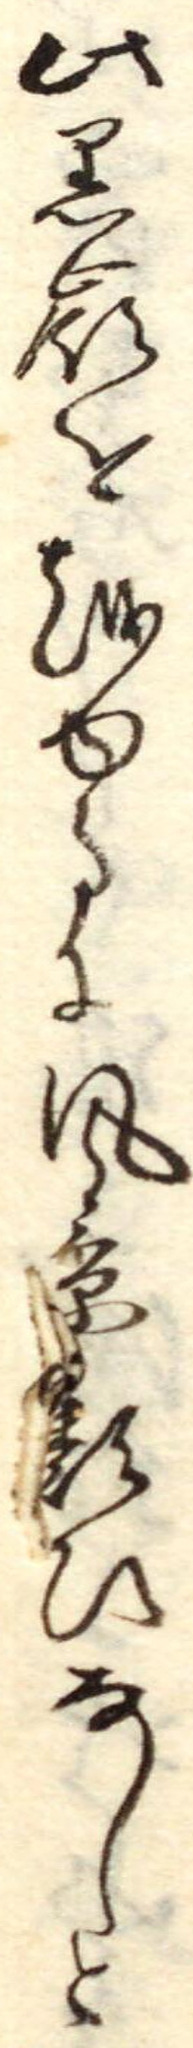此黒嶺を越ゆるに風景類ひなしと
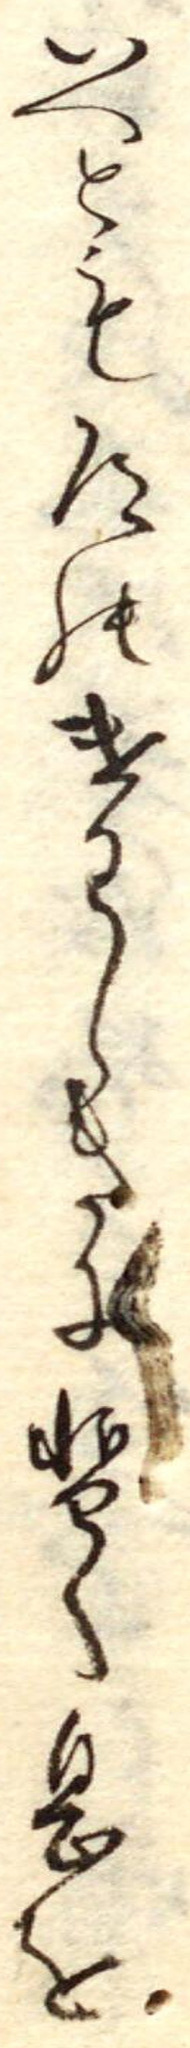いへとも道のけわしきに暫く息を
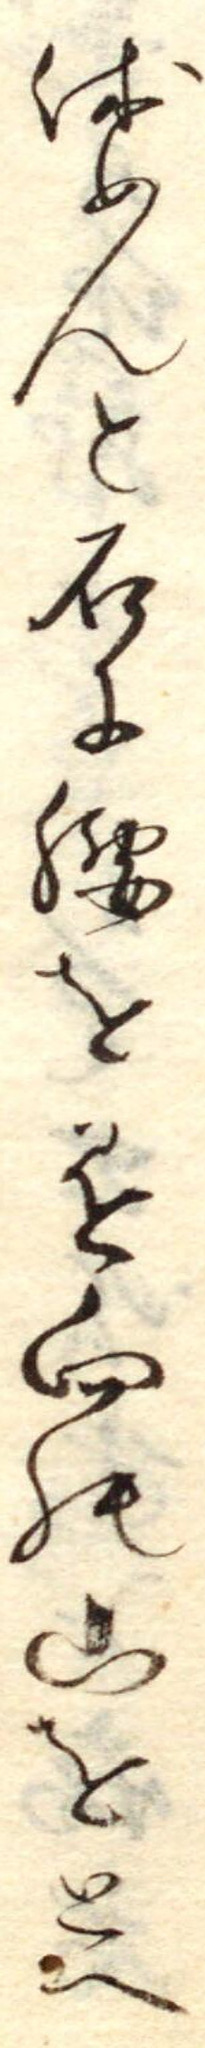休めんと石に腰を懸向の山をとへ
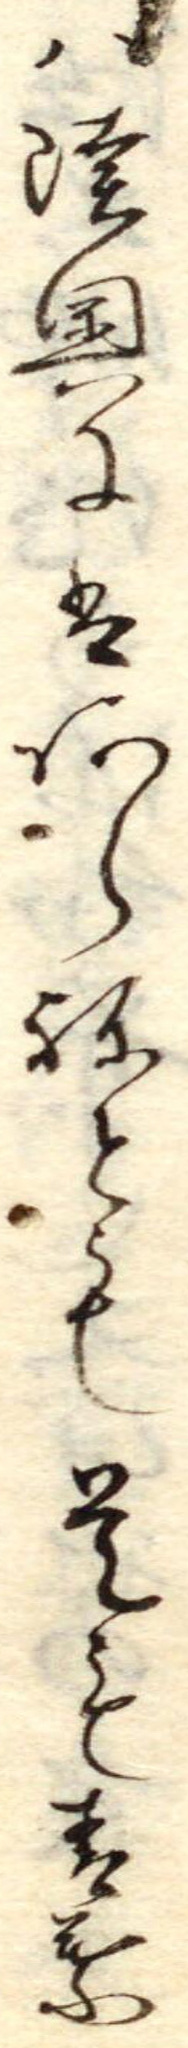は陸奥にはあらねとも是も青葉
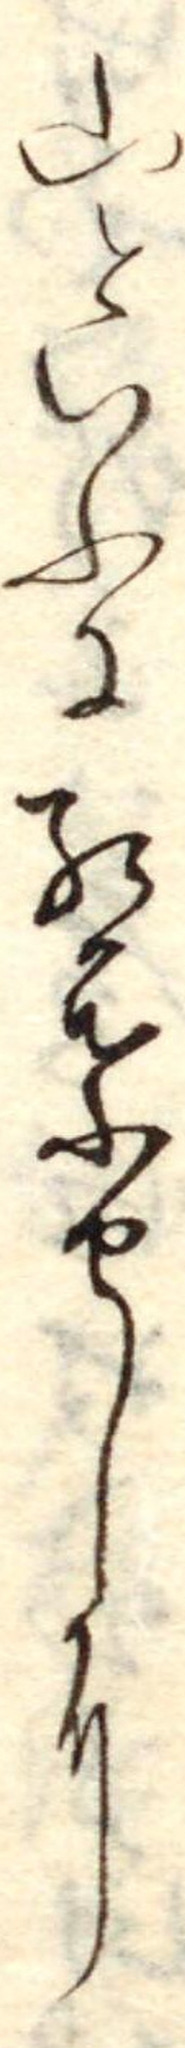山といふに紅葉せしに
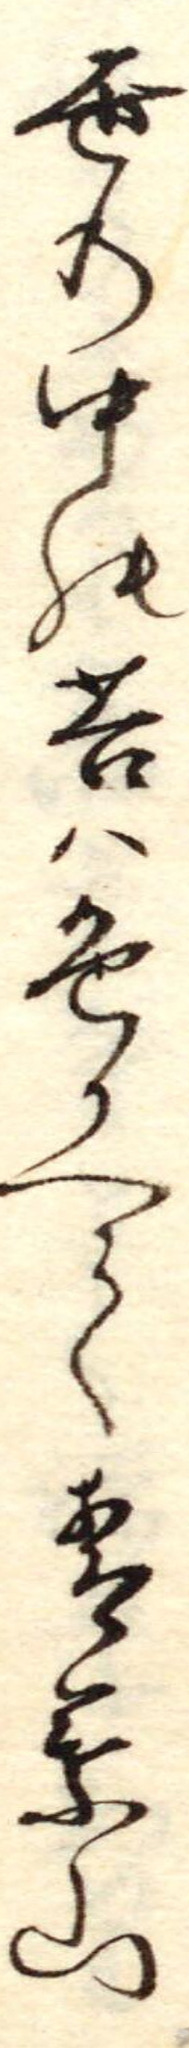世の中の苦は色かへて青葉山
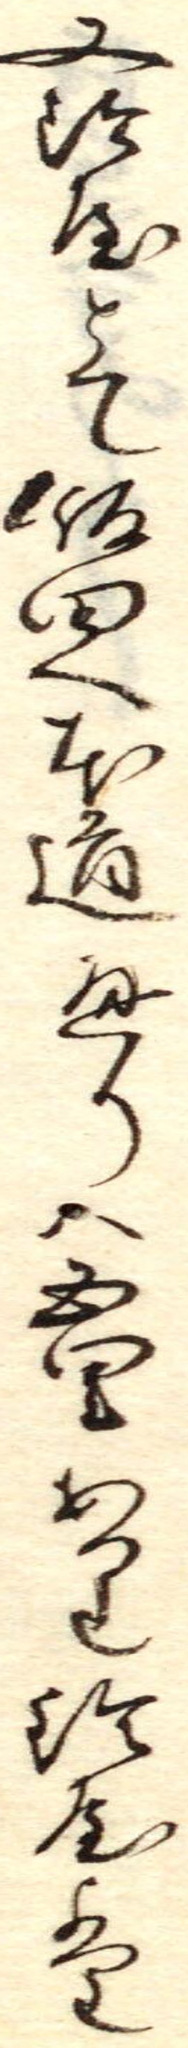又鈴屋とて飯田へ本道通りは五里あり鈴屋より
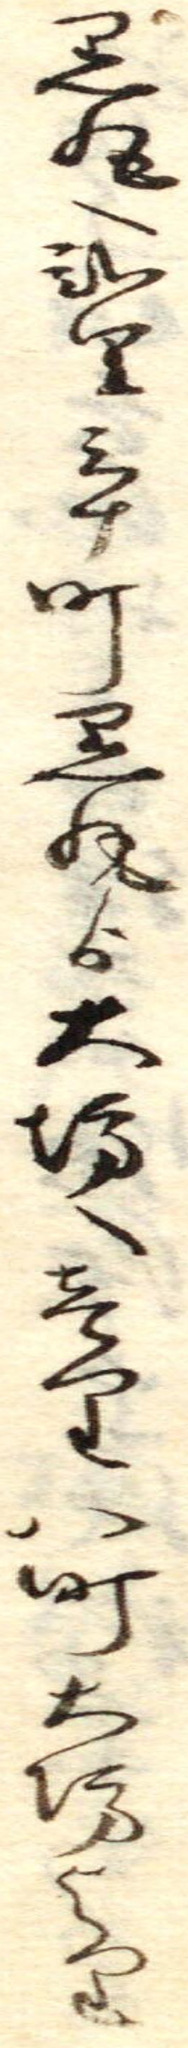黒丸へ弐里三十町黒丸ゟ大坊へ壱里八町大坊より
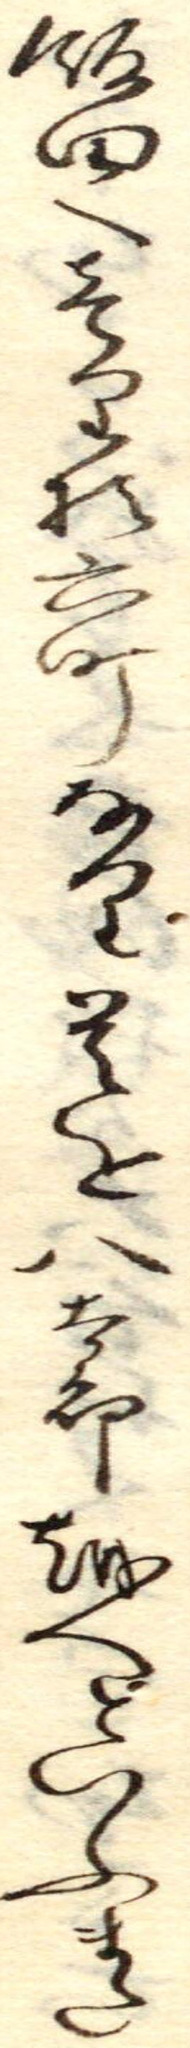飯田へ壱里拾六町なり是を八太郎越へといふまた
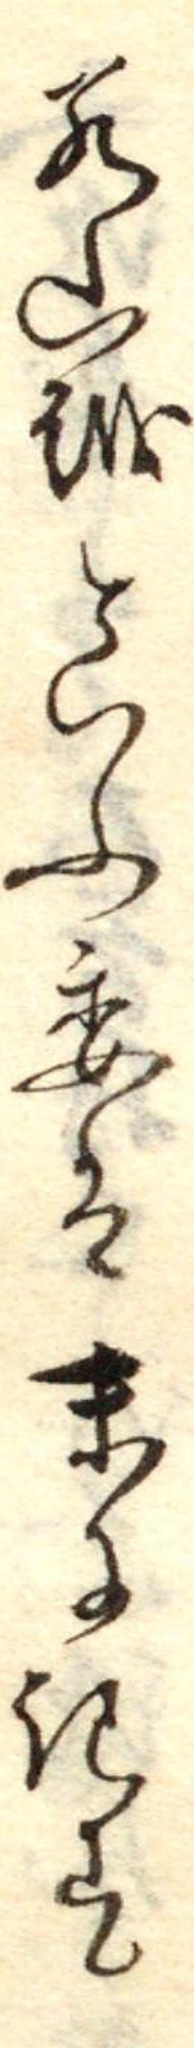若山越といふ委は末に記す

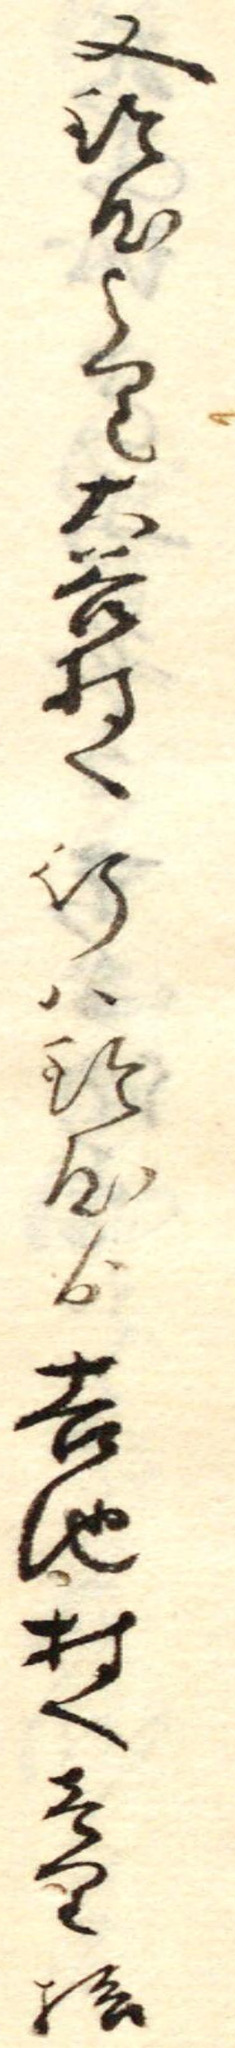又鈴屋より大谷村へ行は鈴屋ゟ吉池村へ壱里拾
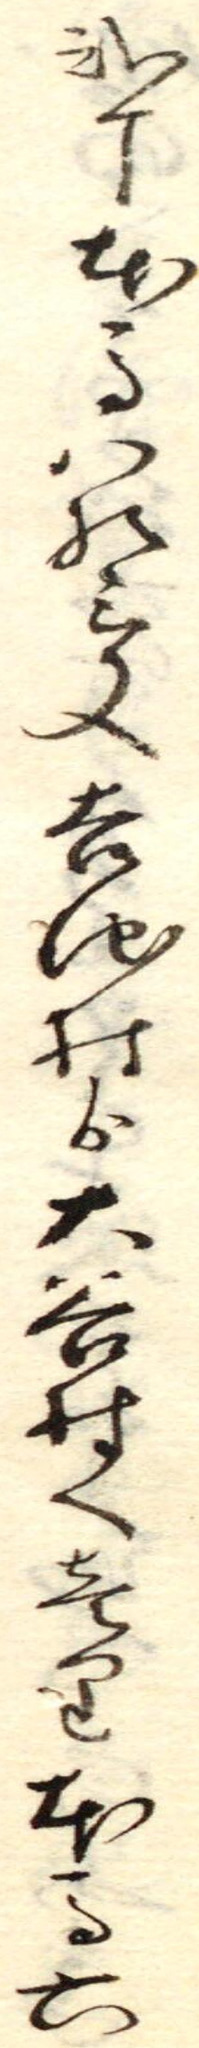弐丁本馬八拾三文吉池村ゟ大谷村へ壱里本馬六
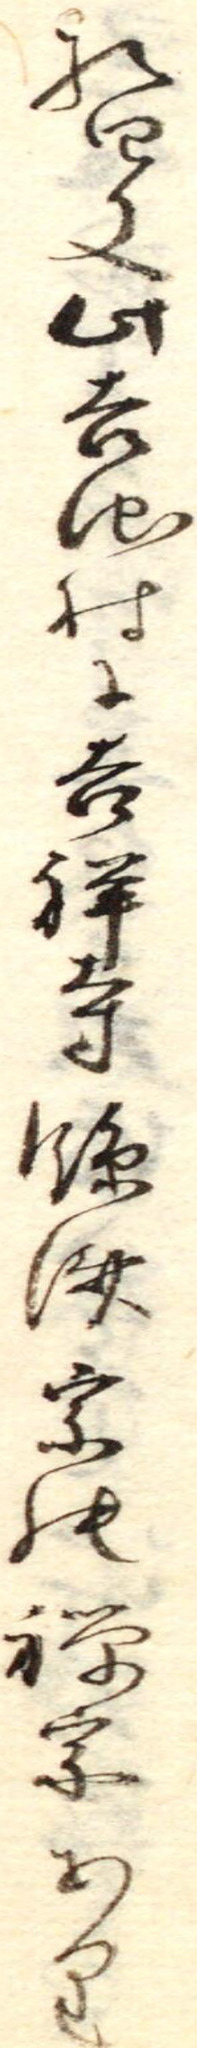拾四文此吉池村に吉祥寺臨済宗の禅宗あり
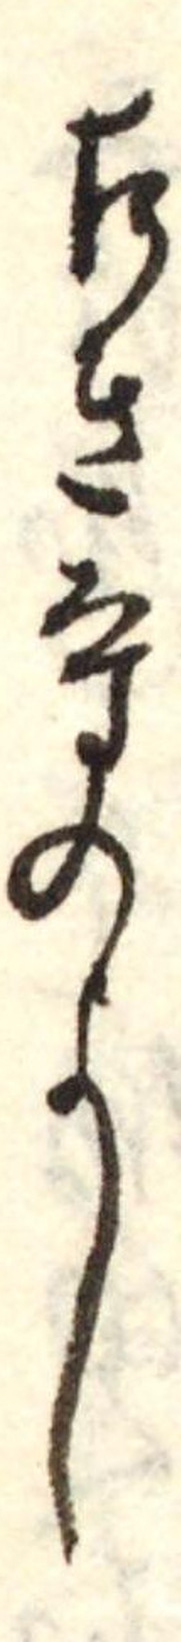古き寺のよし
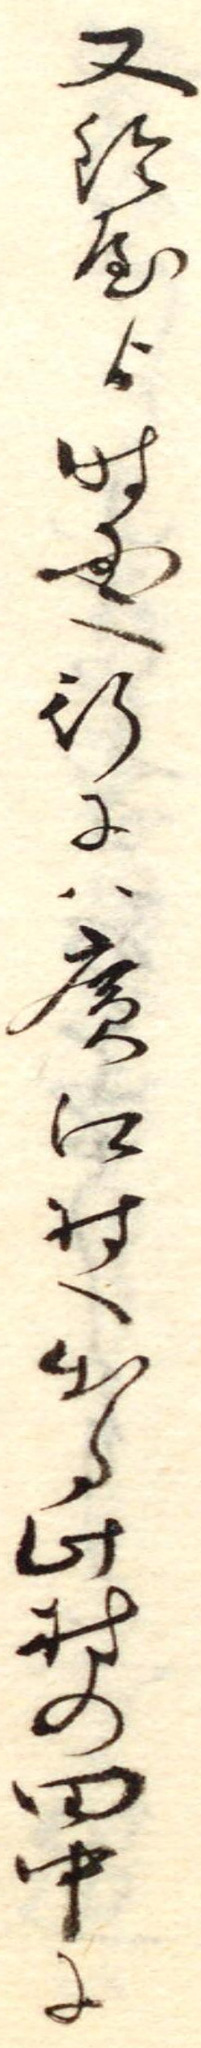又鈴屋ゟ時国へ行には広口村へ出る此村の田中に
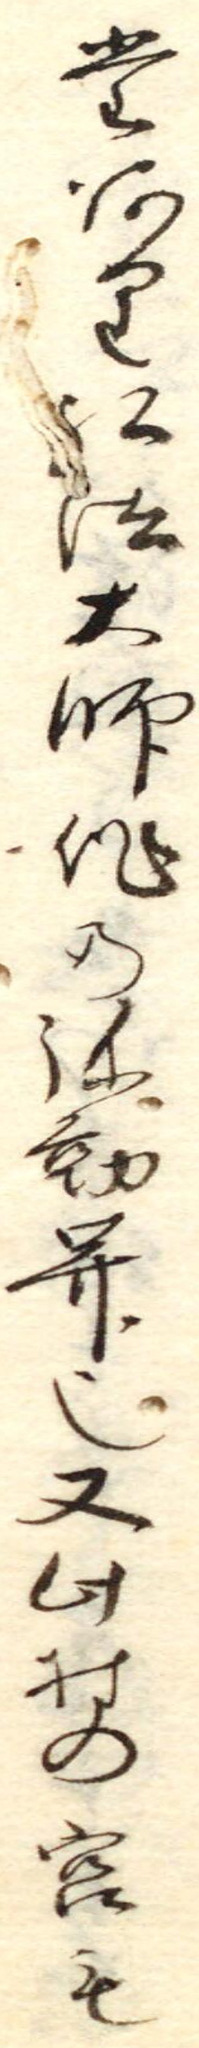堂あり弘法大師作の弥勒菩薩也又此村の宮も
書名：能登名跡誌
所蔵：Ishikawa Prefectural Library
